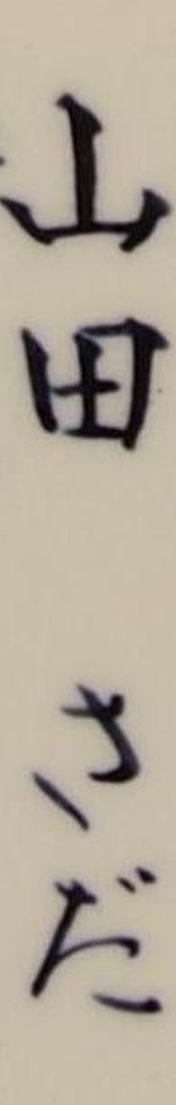山田さだ
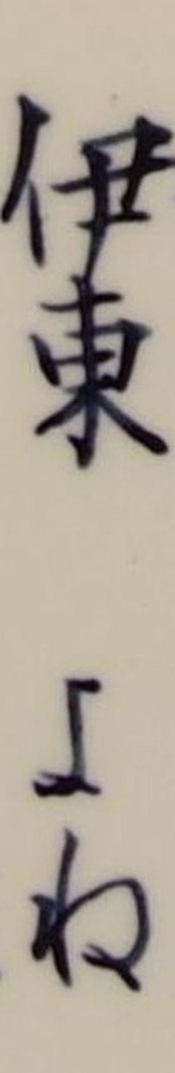伊東よね
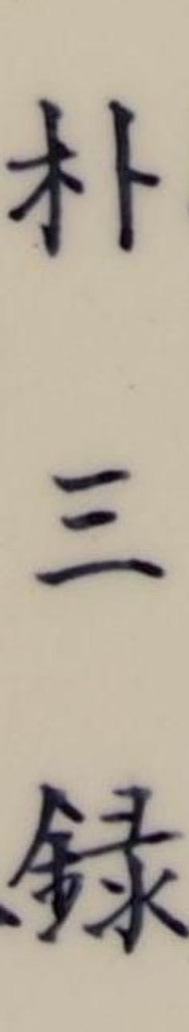朴三録
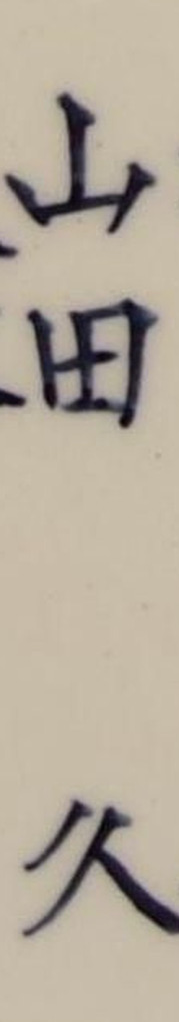山田久
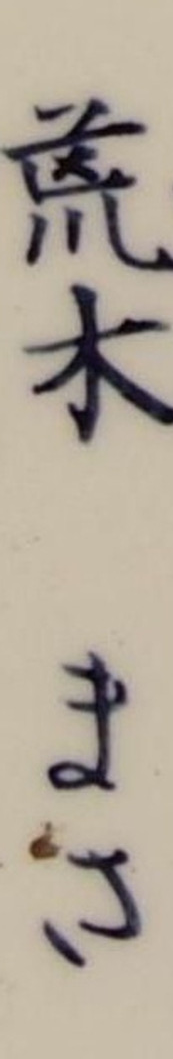荒木まさ
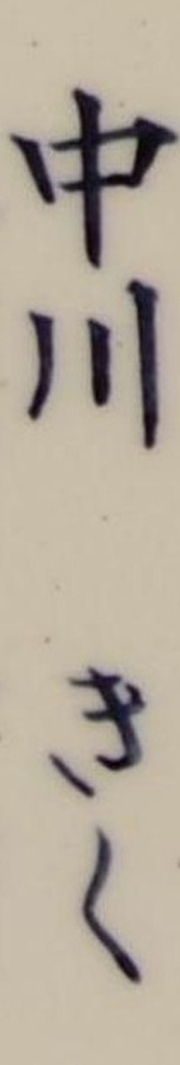中川きく
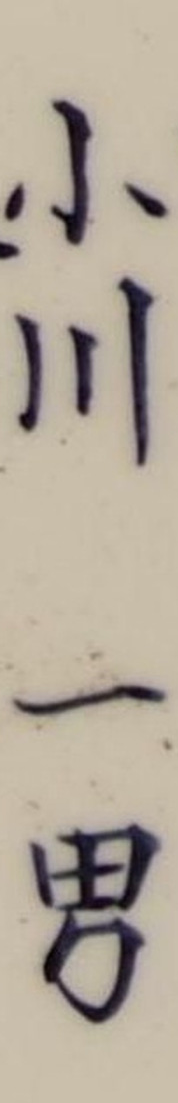小川一男
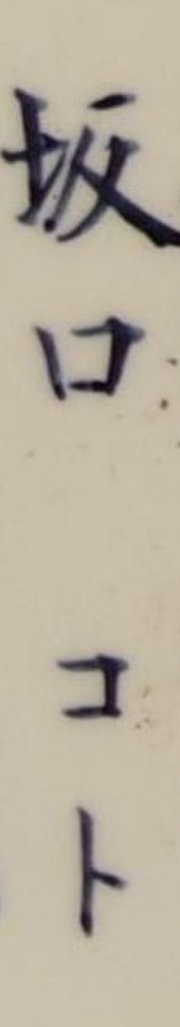坂口コト
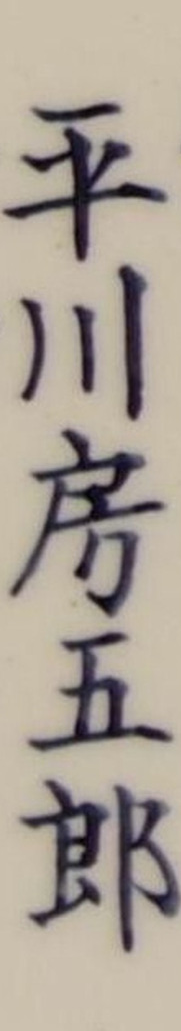平川房五郎
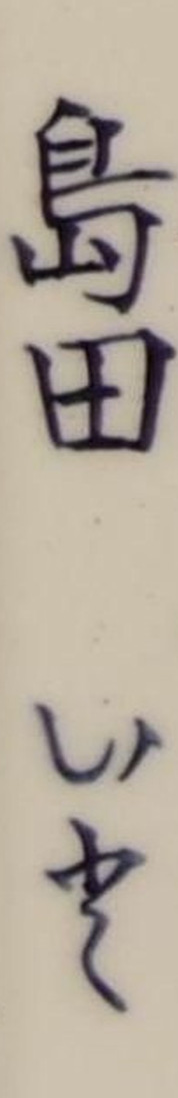島田いと

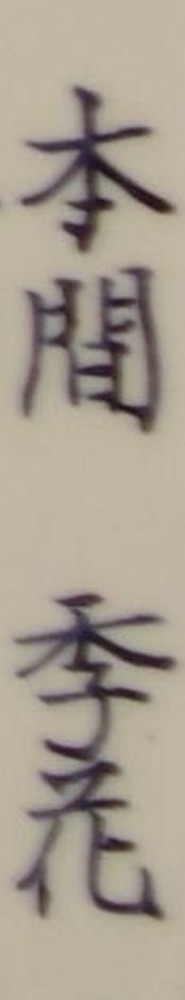本間季花
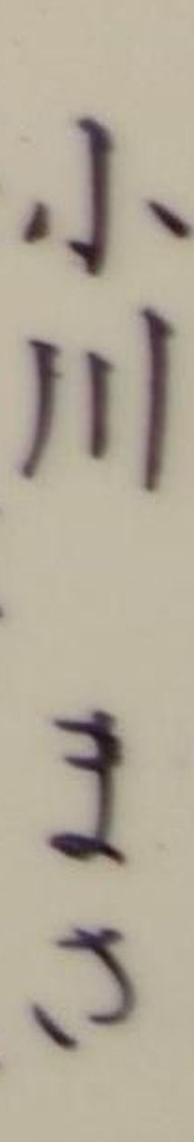小川まさ
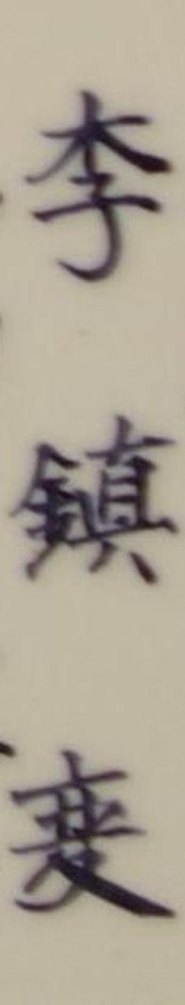李鎮変
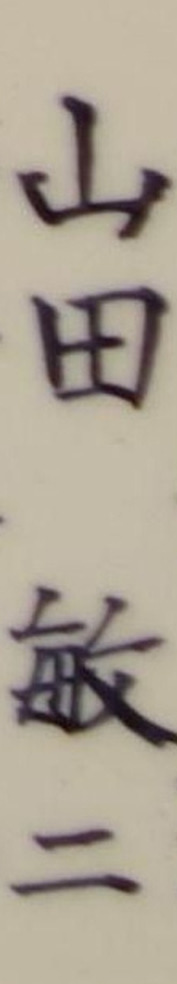山田敏二
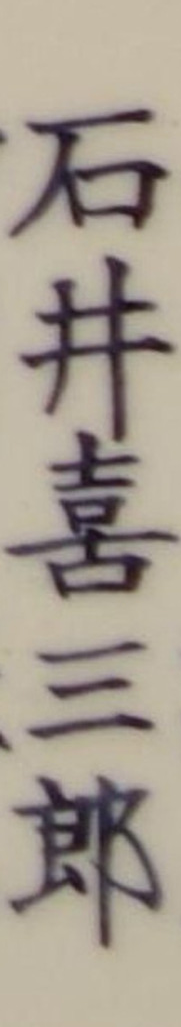石井喜三郎
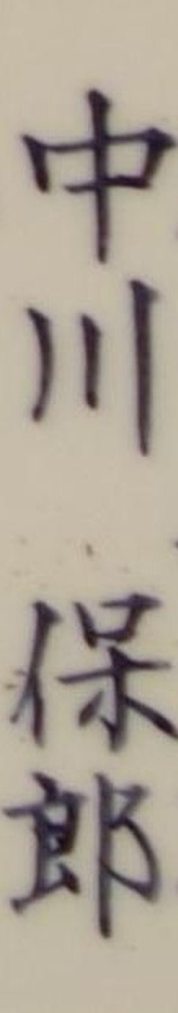中川保郎
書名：E~L
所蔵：高野山金剛峯寺
